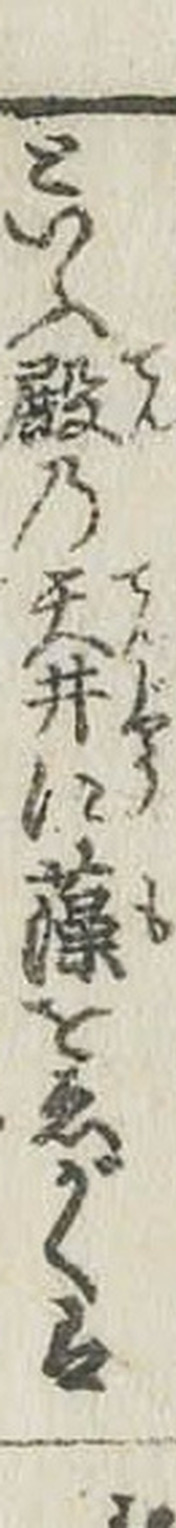といふ殿の天井に藻をゑがくは
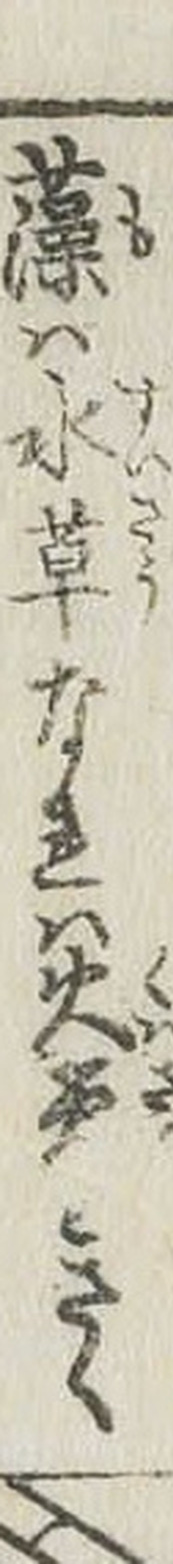藻は木草なれは火災さく
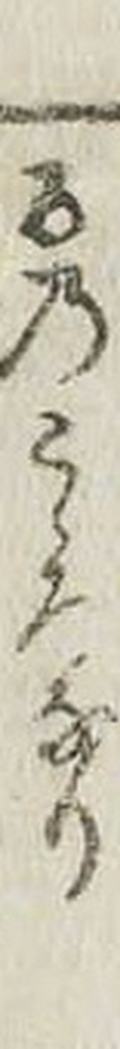るのこゝろなり
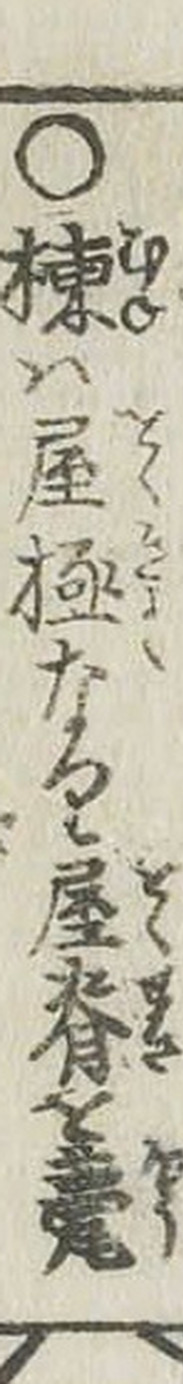○棟は屋極なり屋脊を甍
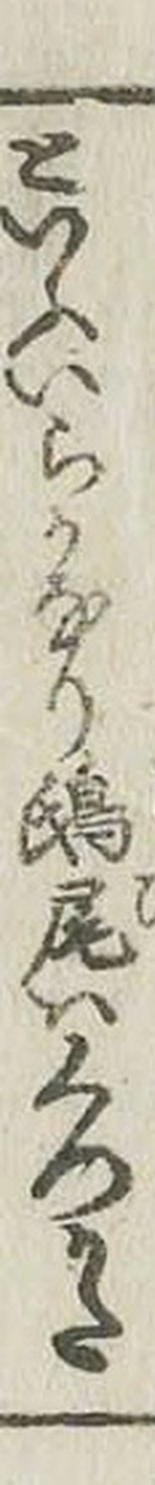といふいらかなり鴟尾はくつかた
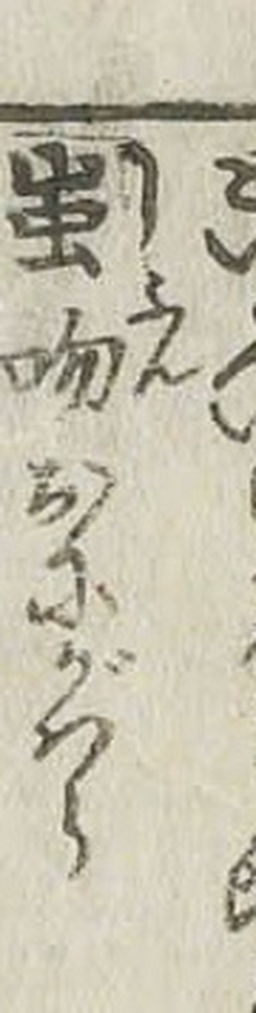蚩吻おにがはら
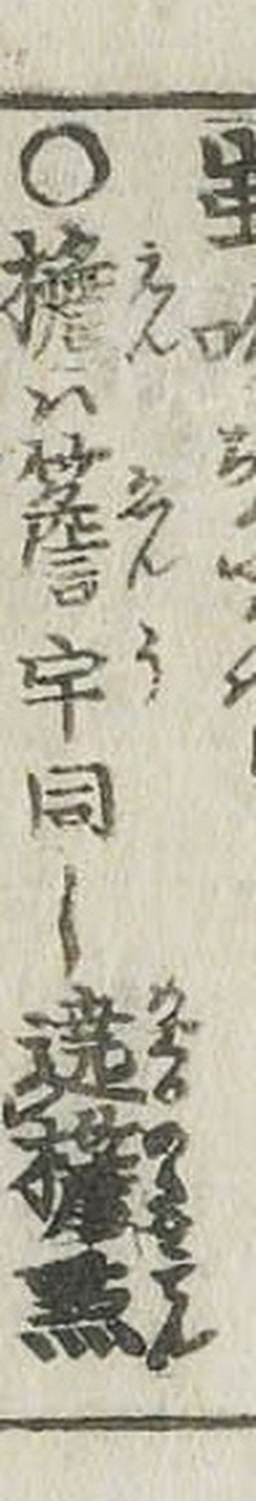○檐は簷宇同し遶点
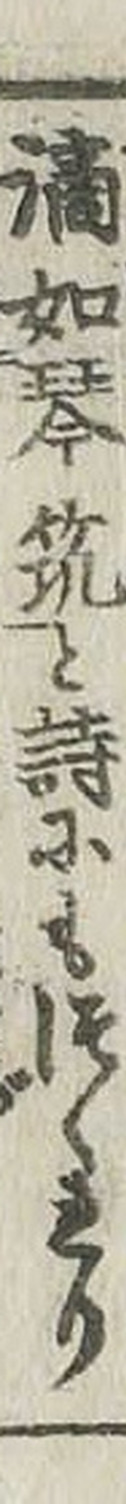滴如琴筑と詩にもつくれり
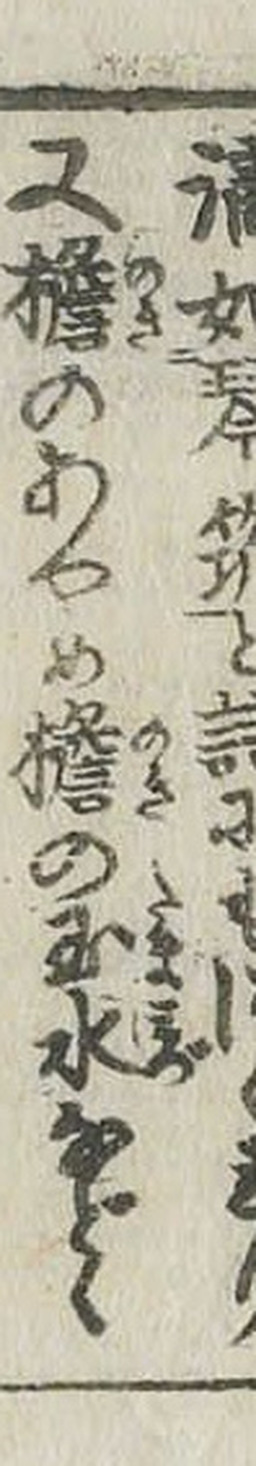又檐のあやめ檐の玉水などゝ
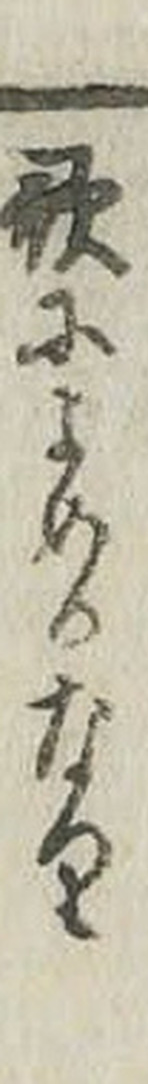歌によめるなり

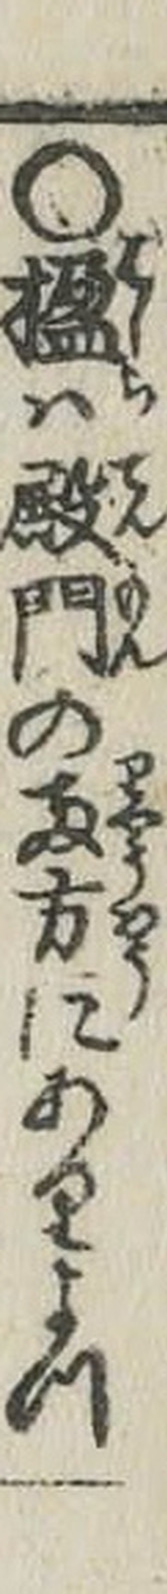○楹は殿門の両方にありよつ
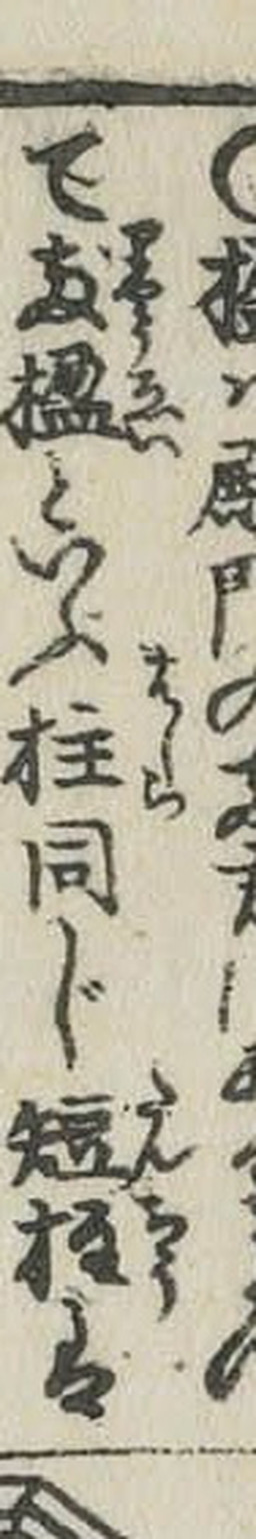て両楹といふ柱同じ短柱は
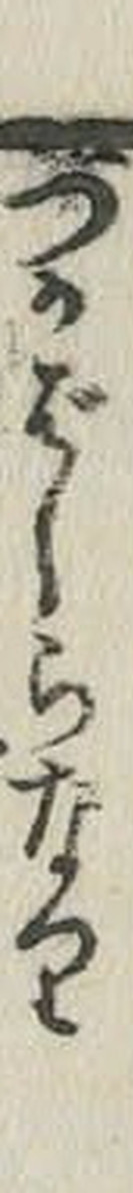つかばしらなり
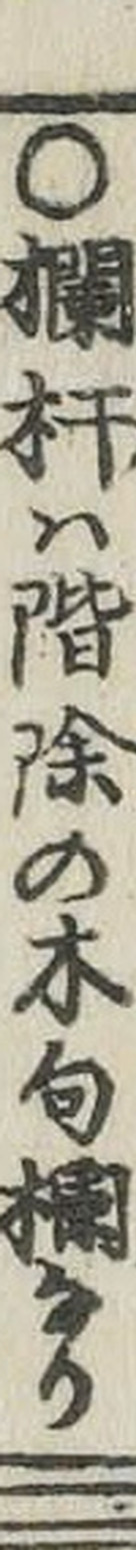○欄杆は階除の木句欄なり
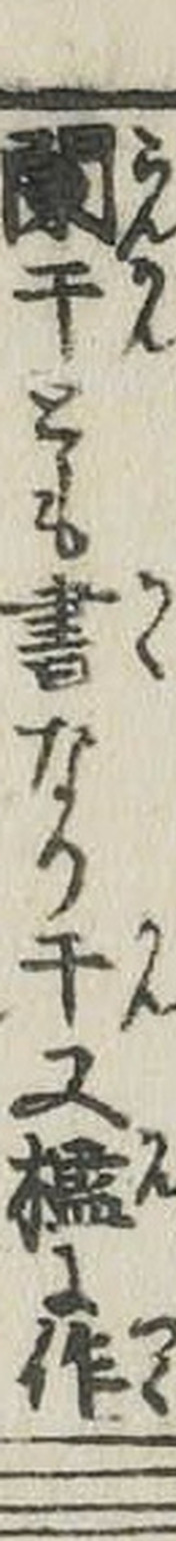闌干とも書なり干又檻に作
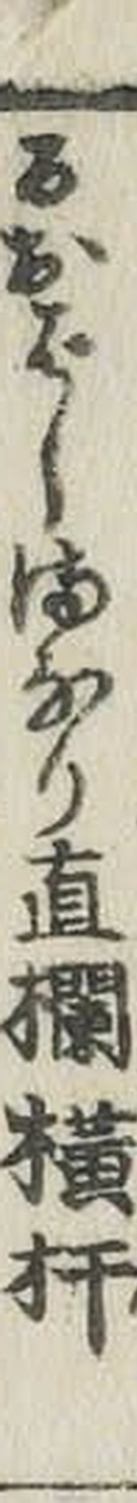るおばしまなり直欄横杆
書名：増補頭書訓蒙図彙大成 10巻 2:巻之1-3
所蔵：東京学芸大学教育コンテンツアーカイブ
